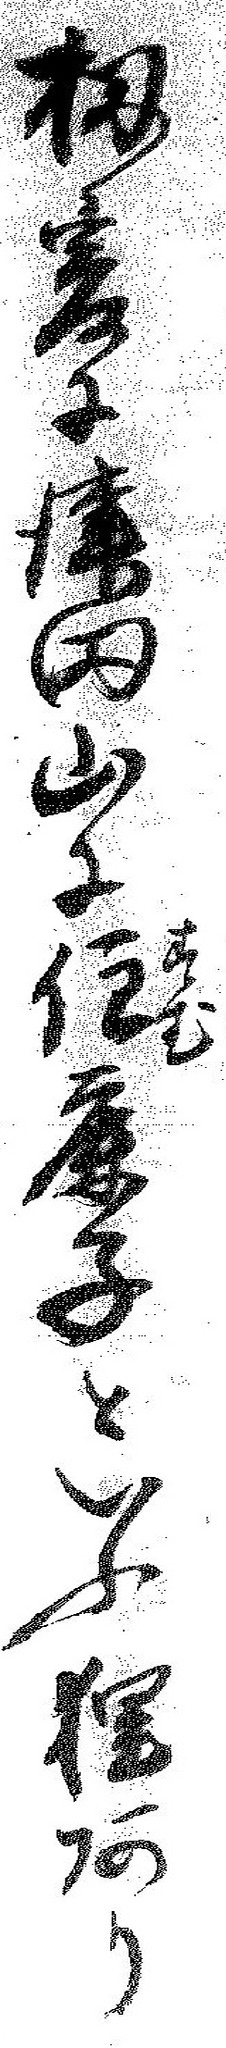扨爰に津田山に住鹿子といふ狸あり
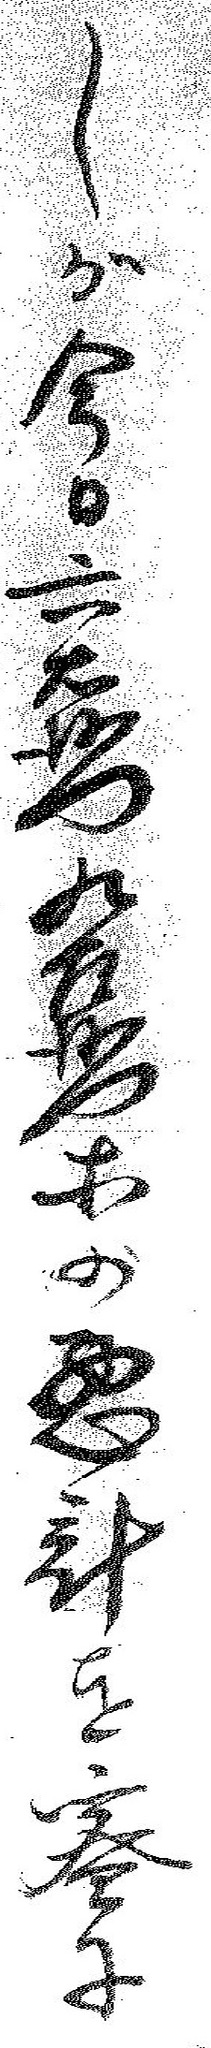しが今日六右衛門九左衛門等の悪計を密に
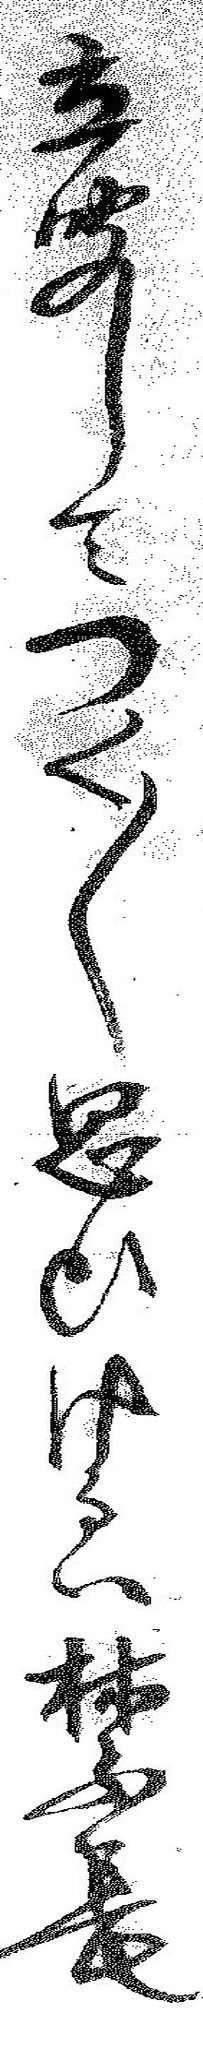立聞してつく〳〵思ひけるは禁長
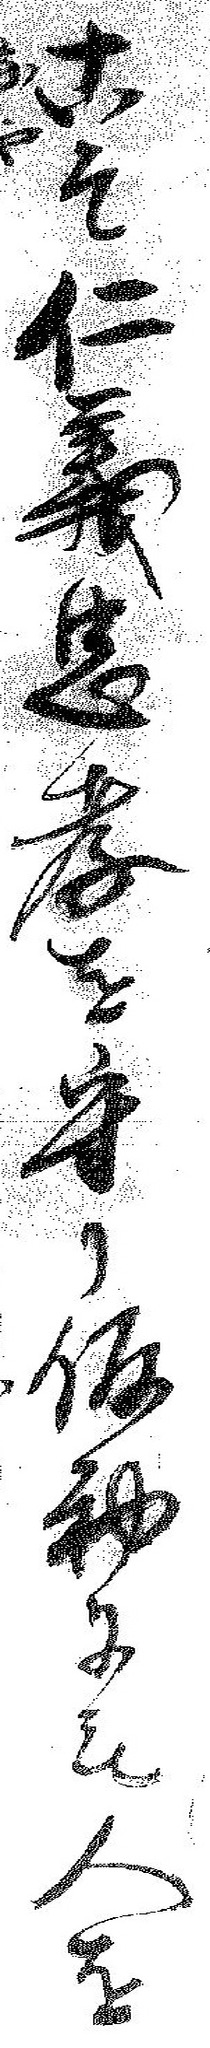こそ仁義忠孝を守り仮初にも人を
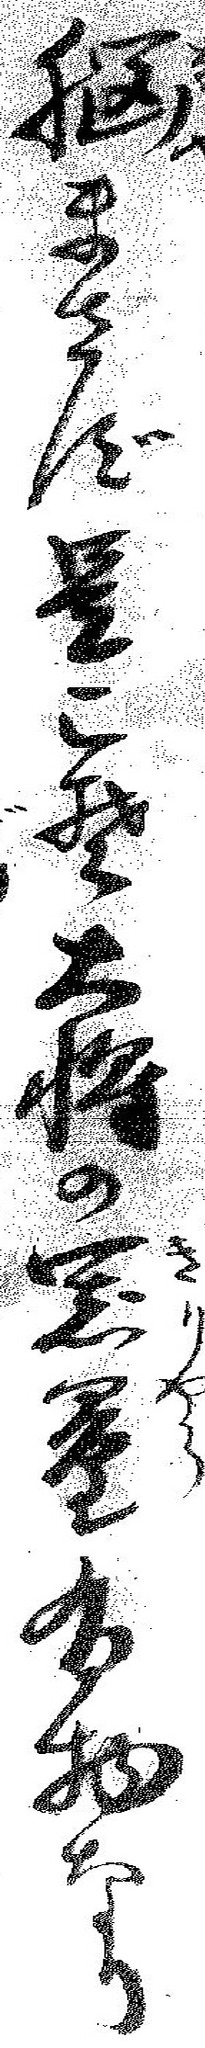悩まさず是こそ大将の器量有物なり
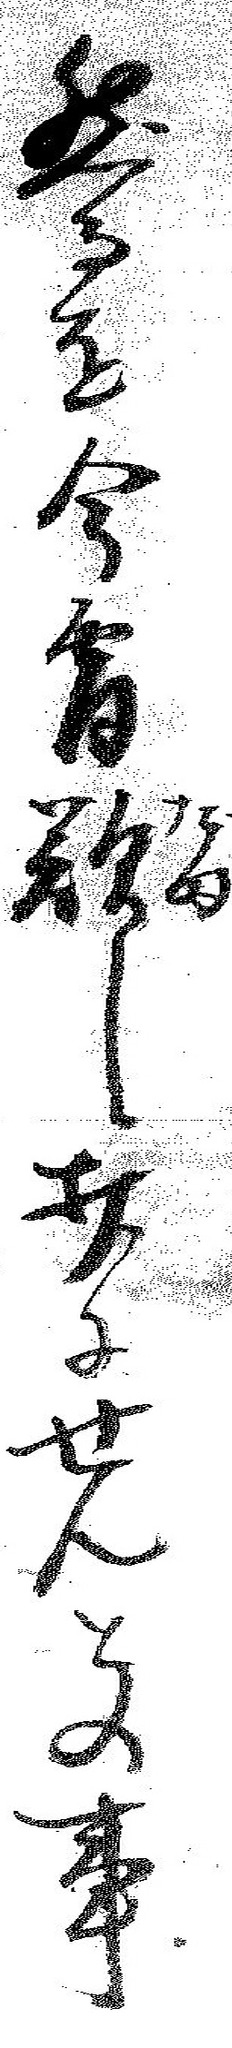然るを今宵歎し打にせんとの事
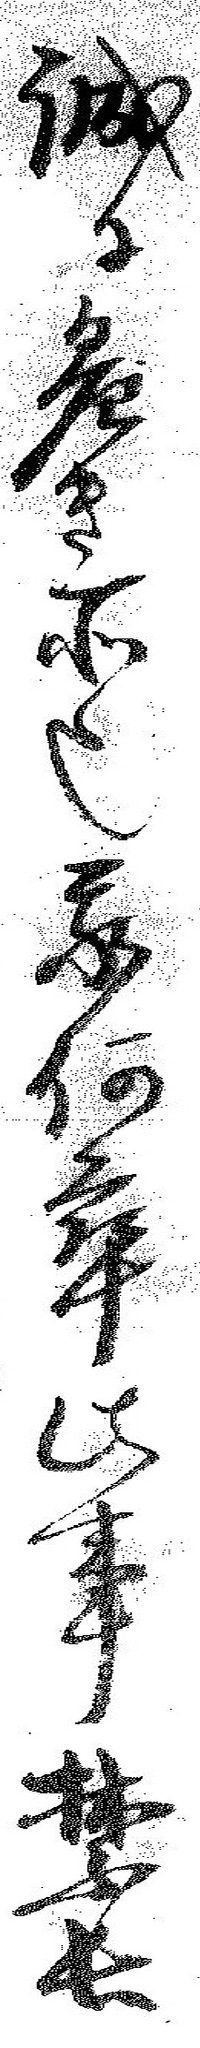誠に危き所也我何卒此事禁長
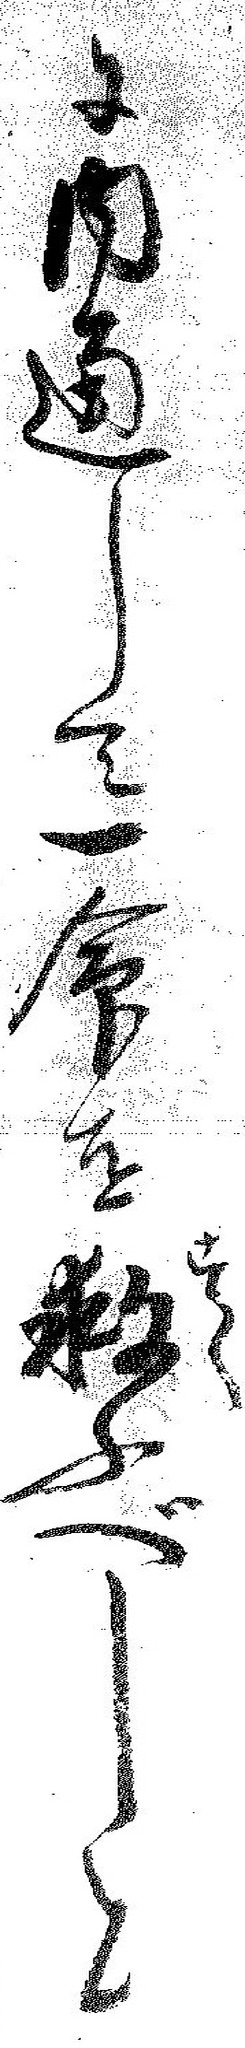に内通して一命を救ふべしと
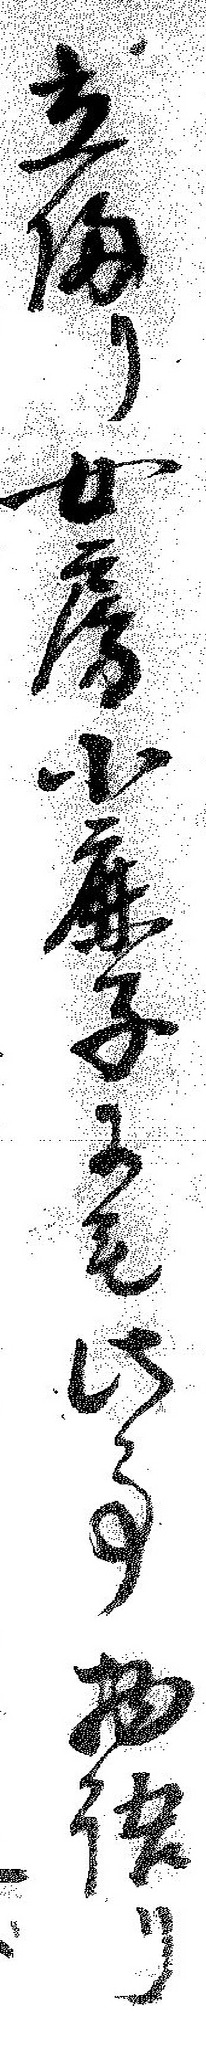立帰り女房小鹿子にも此事物語り
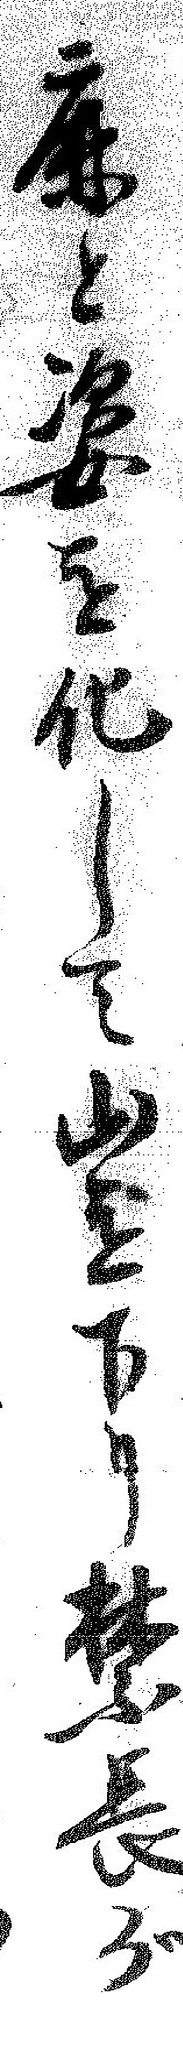鹿と姿を化して山を下り禁長が
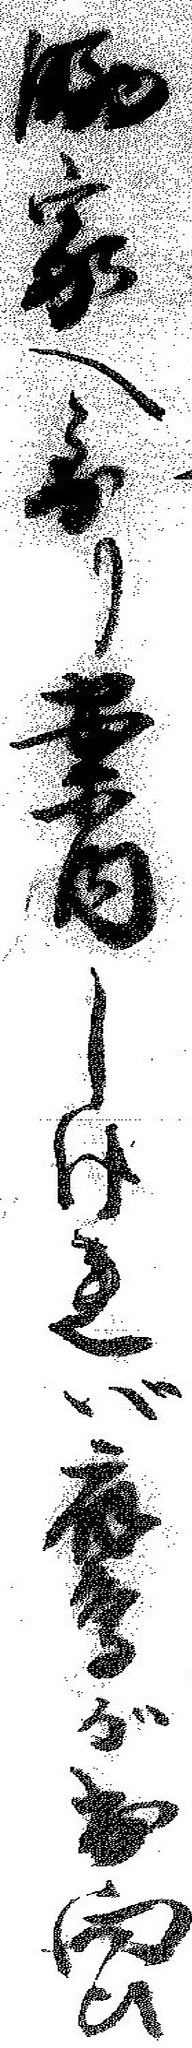晒家へ至り案内しければ鷹が出向ひ
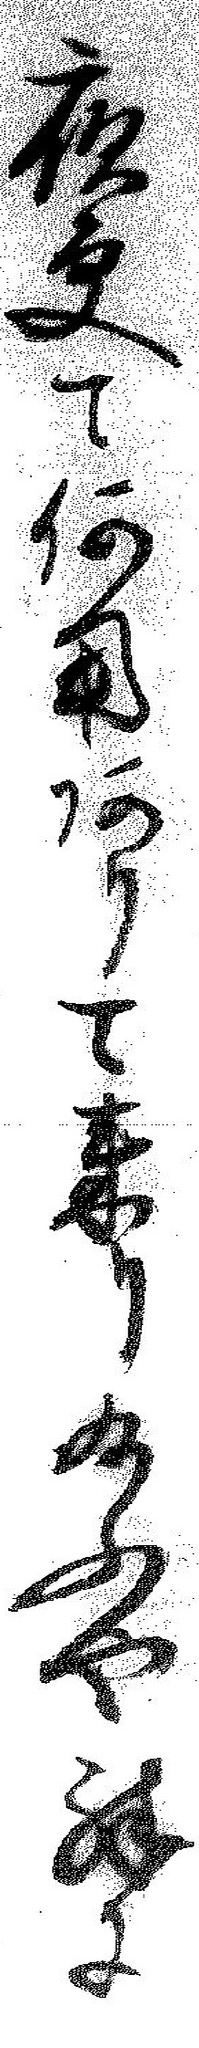夜更て何用ありて来り給ふや殊に
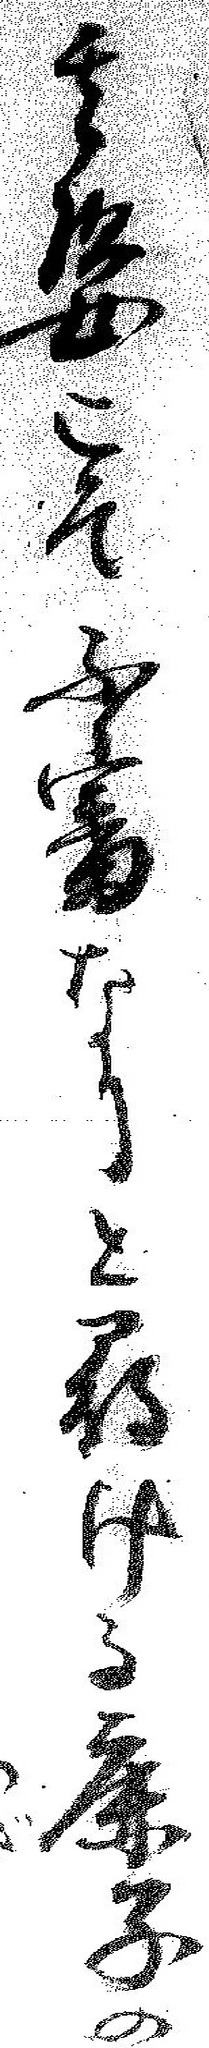其姿こそ不審なりと尋ける鹿子の
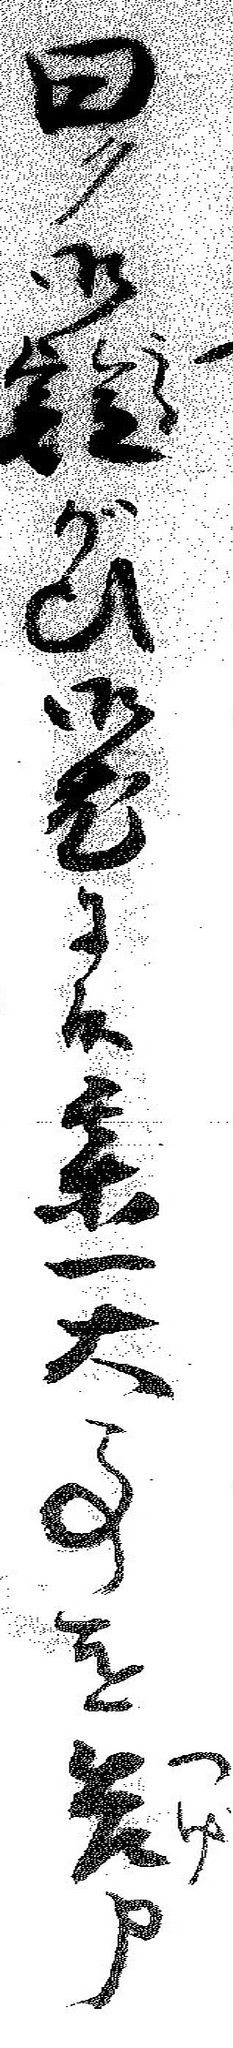曰く御疑がひ御尤に候某一大事を告申
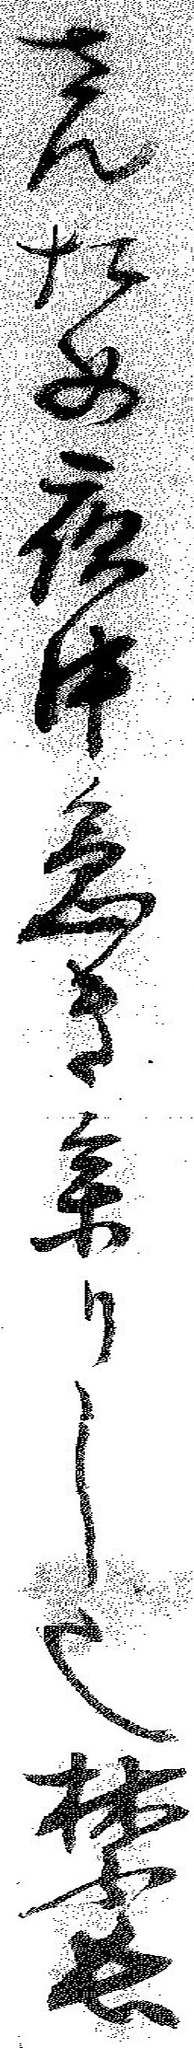さんため夜中急ぎ参りし也禁長
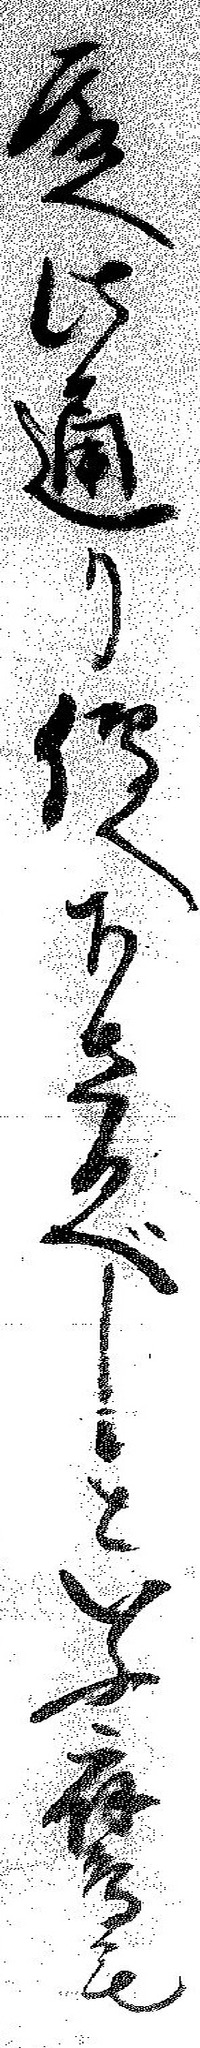殿へ此通り伝へ下さるべしといふ鷹も
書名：近頃古狸珍説　礼義智信
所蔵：徳島県立図書館
